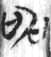申
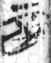梄（酉）
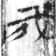戌
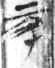亥
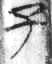子
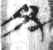丑
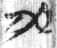卯
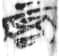晨
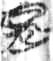是
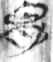{胃刀}（謂）
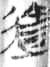達
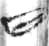日
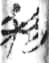利（利）
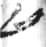㠯（以）
